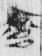舒
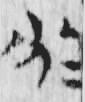小人
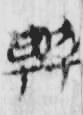與
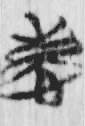慶
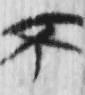不
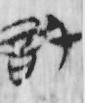○（信）
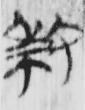殺
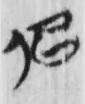○（宣）
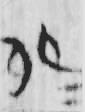卯
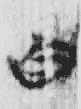自
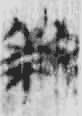殺
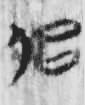○（宣）
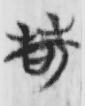苛
